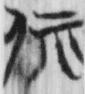𫵖
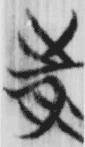之月
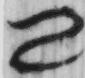己
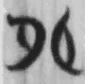卯
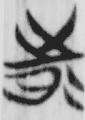之月
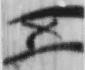五
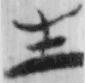生
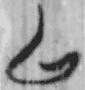㠯（以）
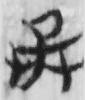丞
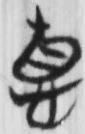惪
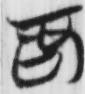爲
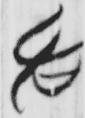左
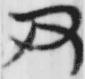尹
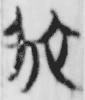{力它}
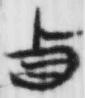貞
